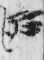○（聽）
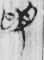受
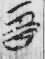○（期）
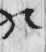九
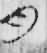月
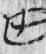甲
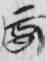晨
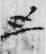之
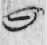日
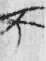不
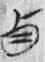貞
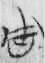周
